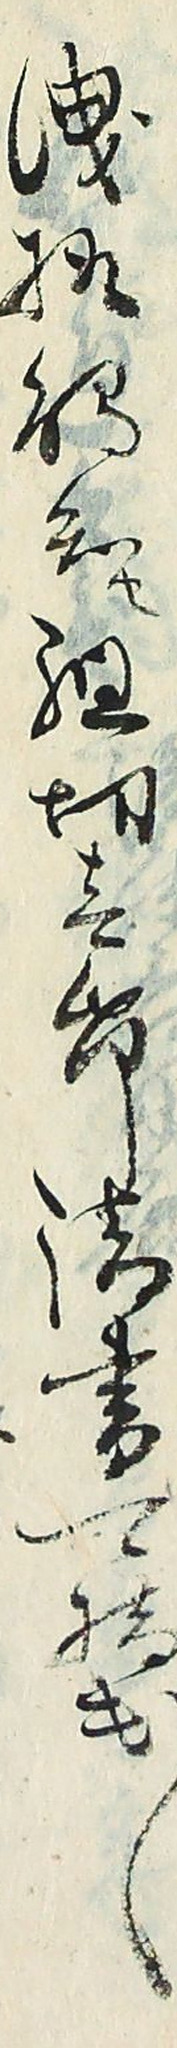洩様触知せ組切壱帋請書可指出候
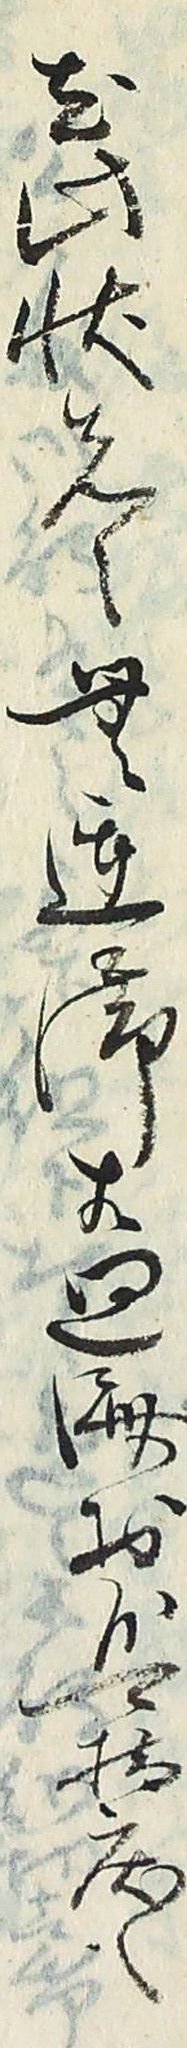尤此状先々無遅滞相廻済村ゟ可指戻候
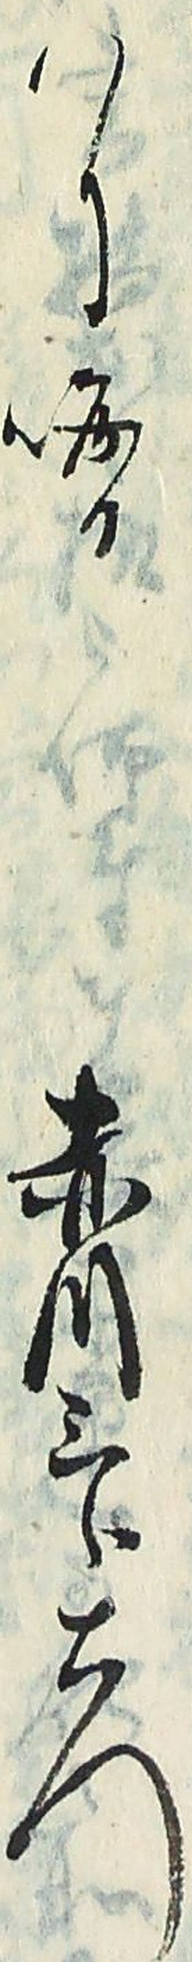八月晦日赤川三郎右衛門
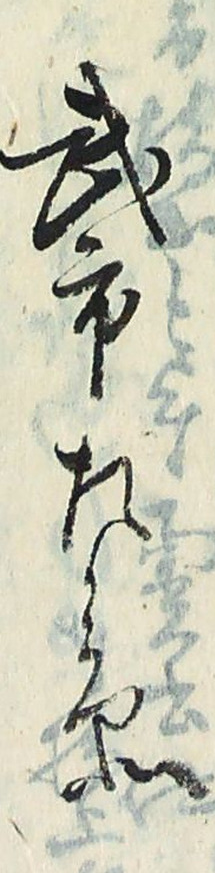武市左兵衛
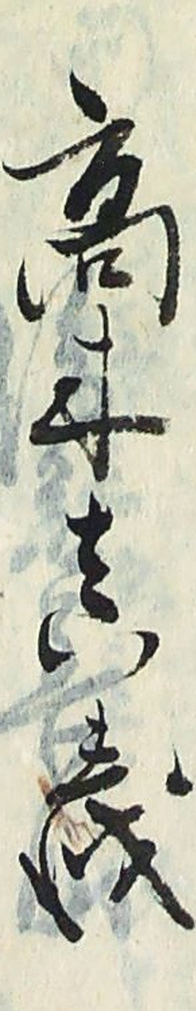高木真蔵
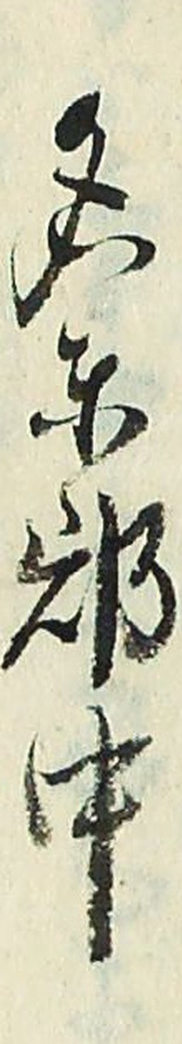名東郡中
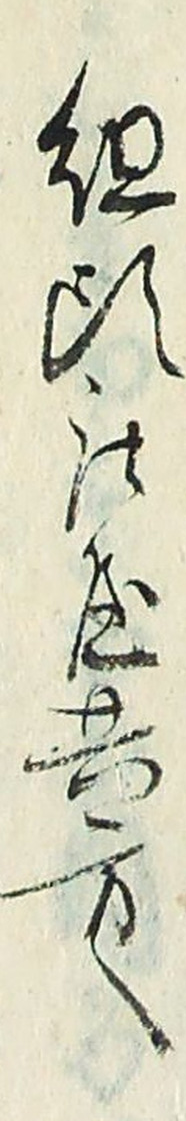組頭庄屋共方へ
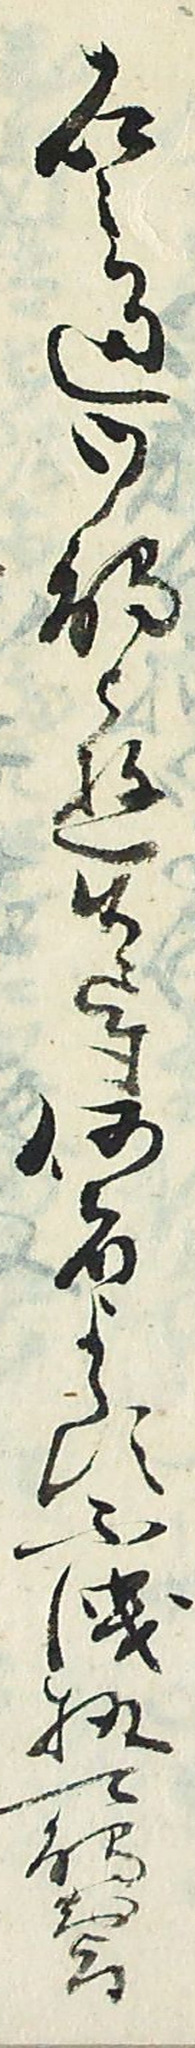右之通御触被遊候に付何者よらす不洩様可触知旨
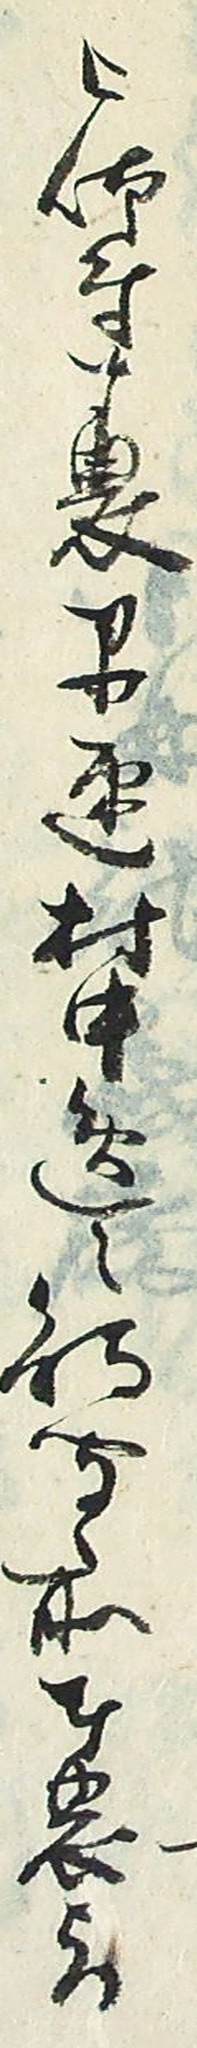被仰付奉畏早速村中逸々触聞候所奉畏旨
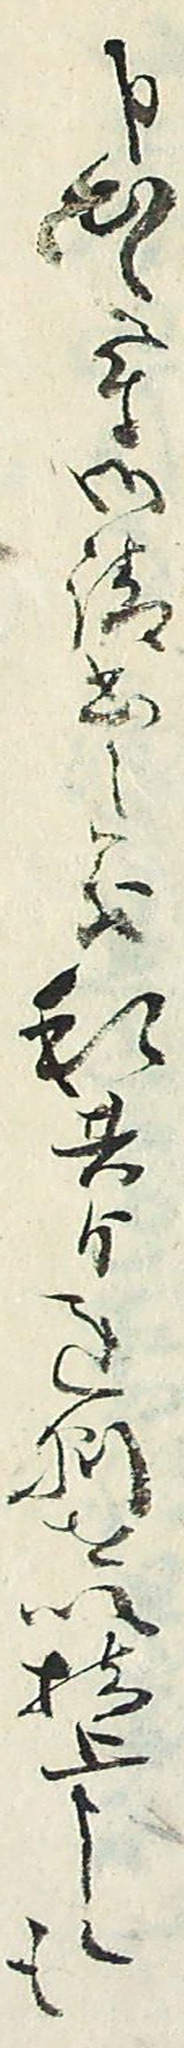申出候に付御請書之義私共ゟ連判を以指上申候以上
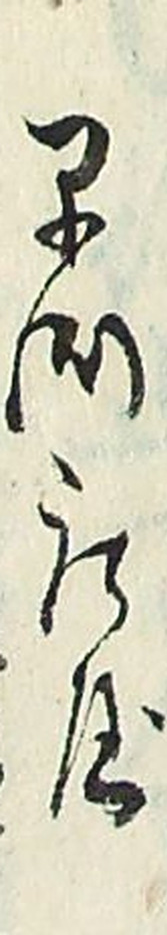早淵庄屋
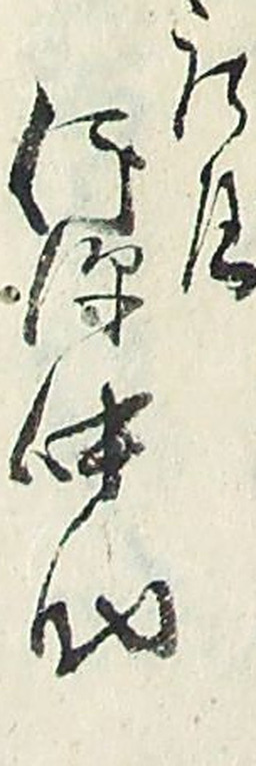伊澤仲助
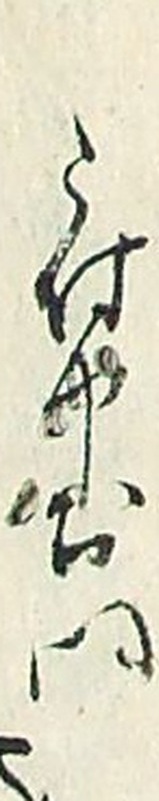府中村同

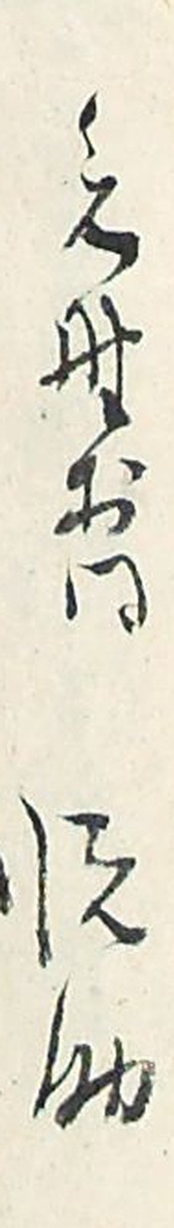矢野村同悦助
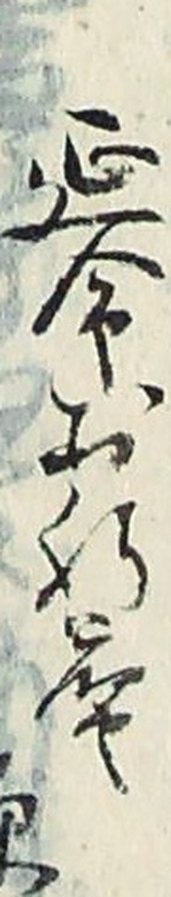延命村肝煎
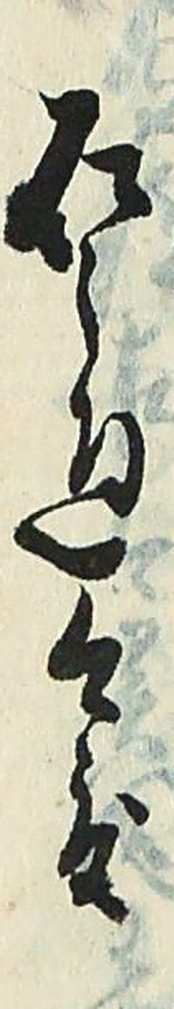右之通今度
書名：諸御用御□受書控
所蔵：鳴門教育大学 Naruto University of Education
